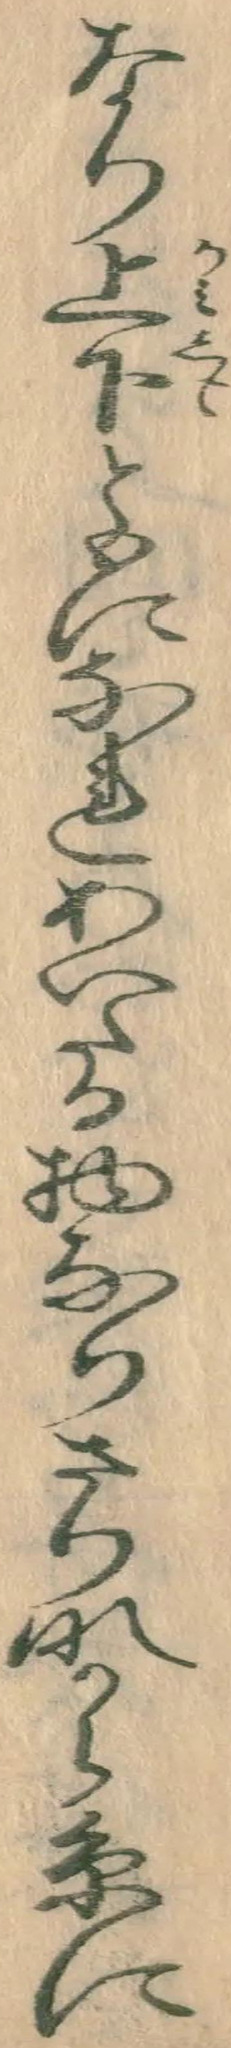なり上下ともになれあいたる物なりさりなから糸に
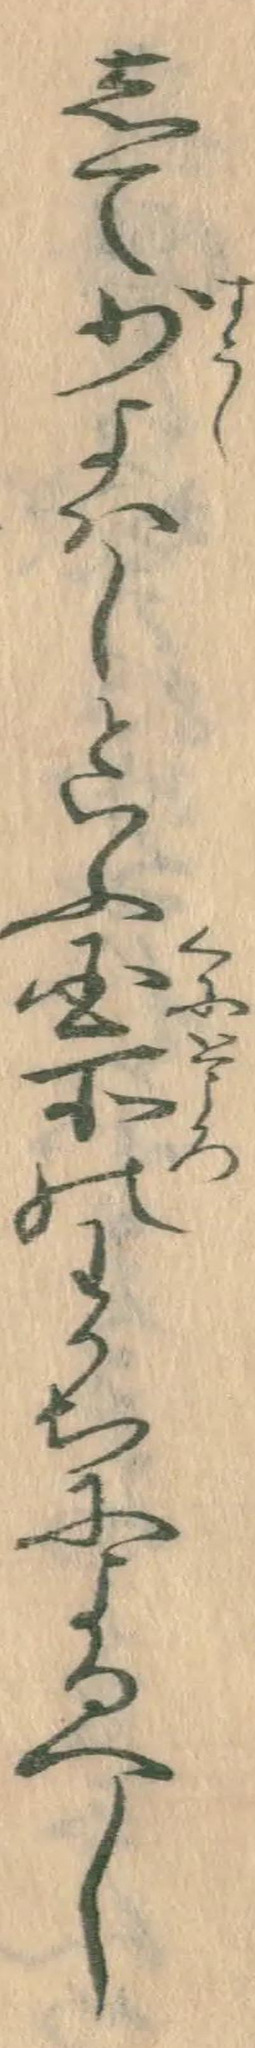して少よはしといふ国所のわかちによるへし
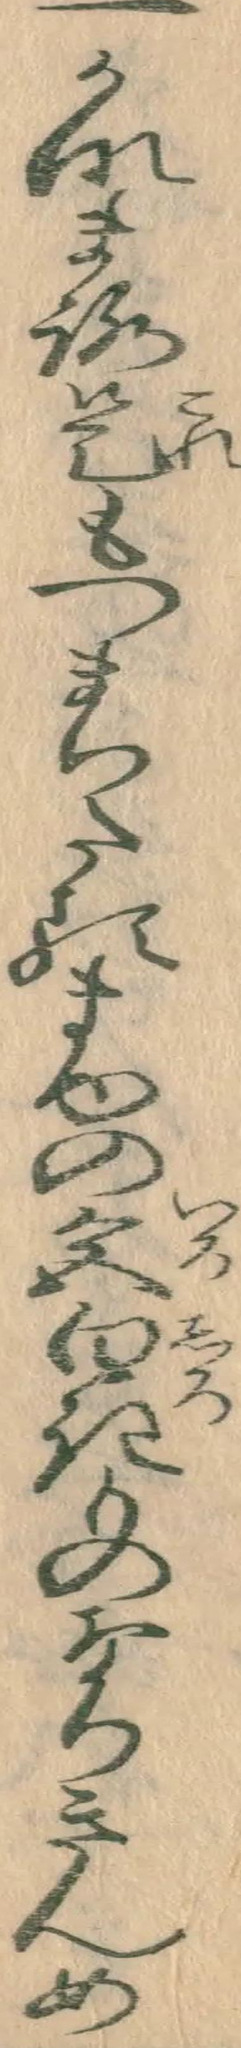一かなまろ是もつまりたるまゆの色白きものなりきんめ
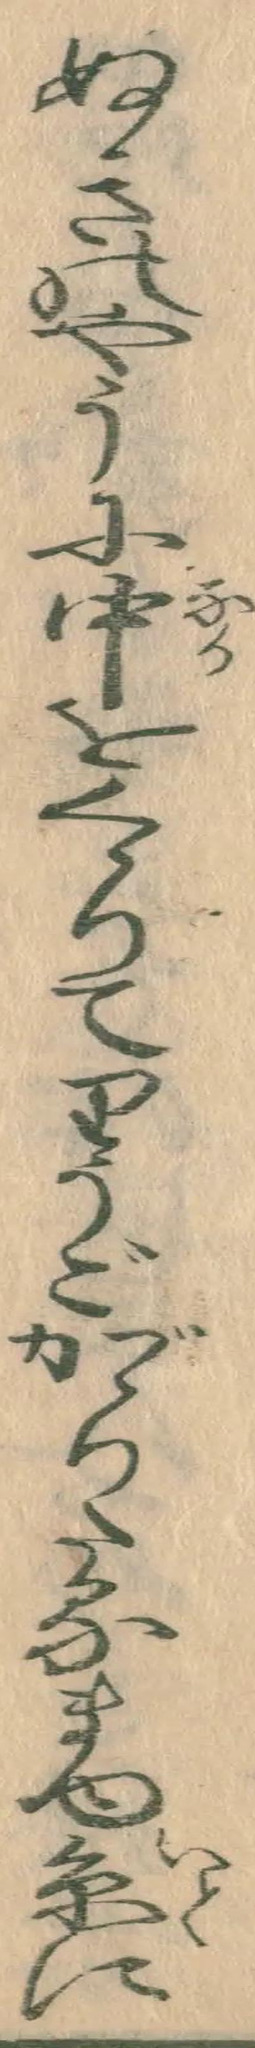ぬきのやうに中をくゝりてりうごがゝりたるまゆ糸に
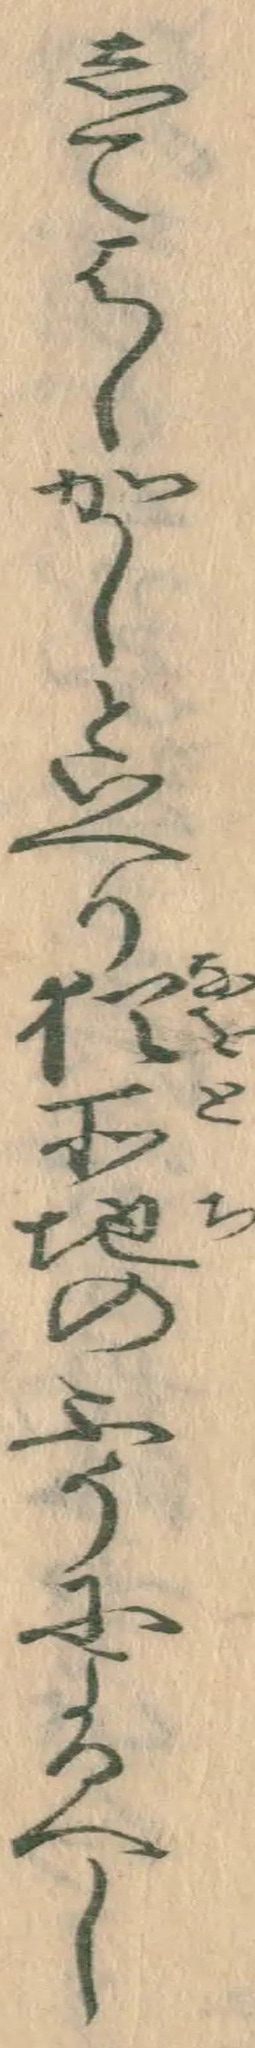してはしかしといへり猶所地のふうによるへし
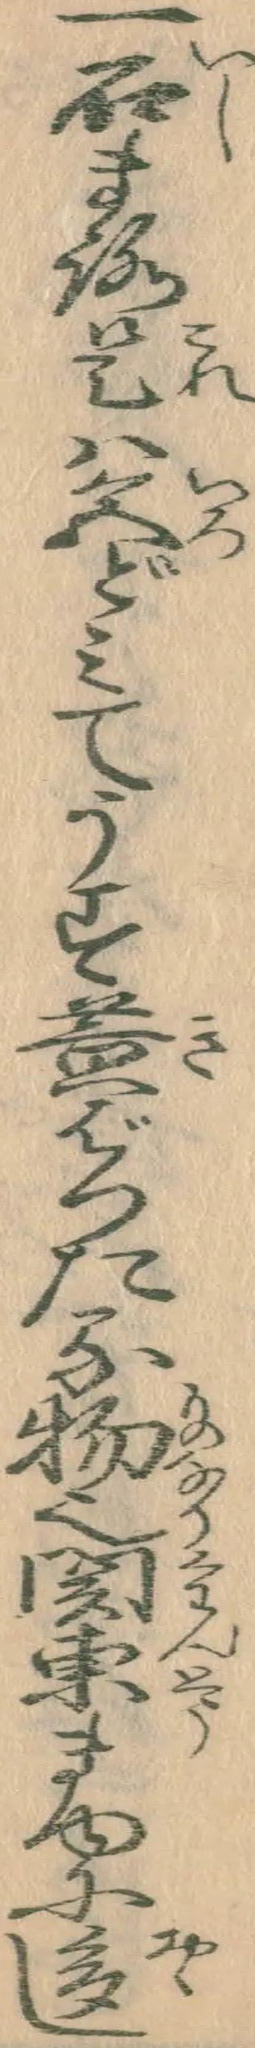一石まろ是は色どみてうす黄ばりたる物也関東まゆに多し
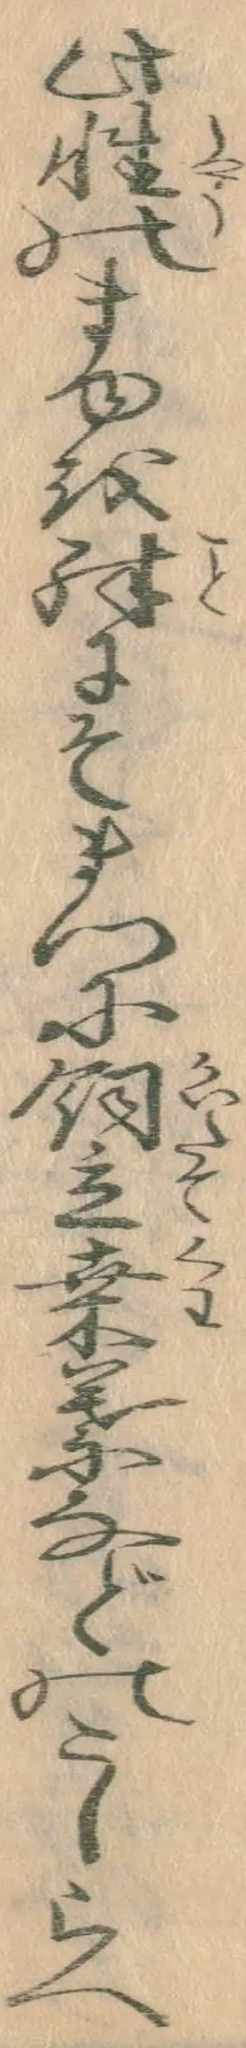此性のまゆを殊にそまつに飼立桑葉などのこしらへ
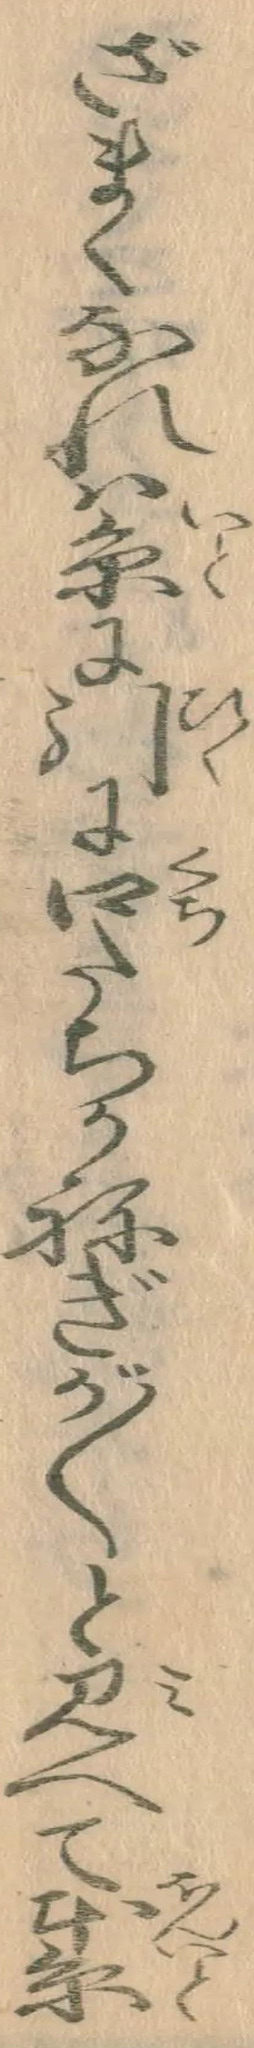ざまくなれは糸に引に口たちかねぎが〳〵と見へて本糸
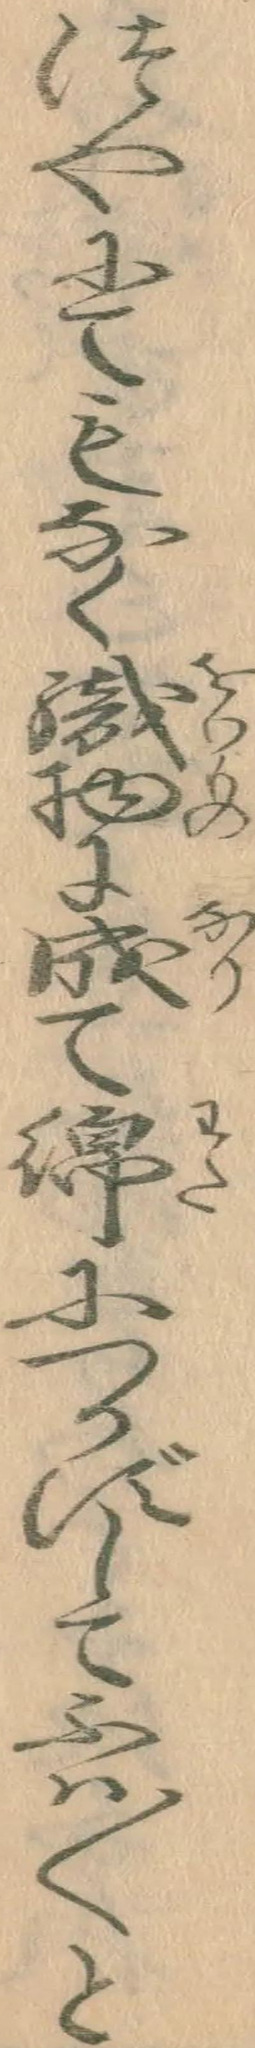つやにてもなく織物に成て綿につかずしてふは〳〵と
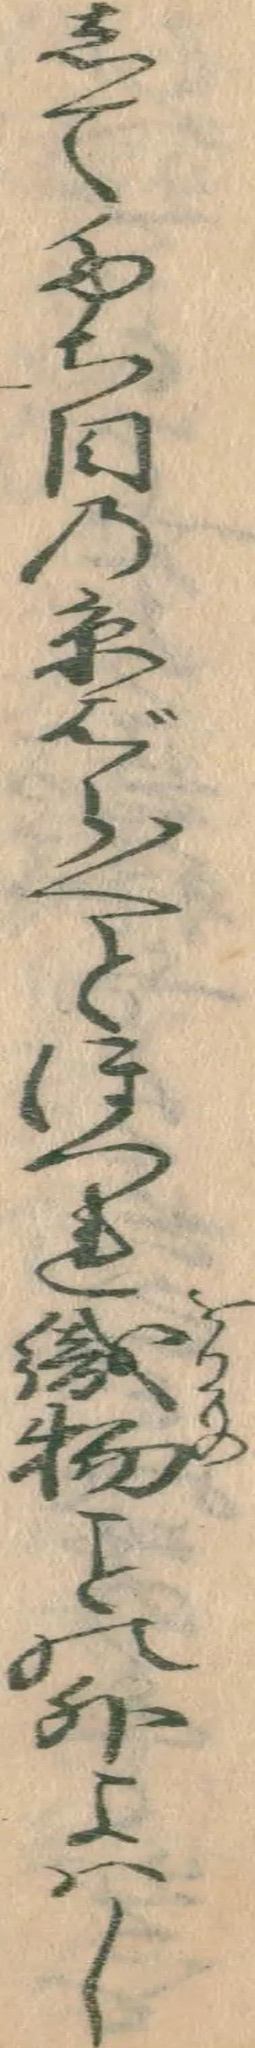してたち目の糸ばら〳〵とほつれ織物ことの外よはし
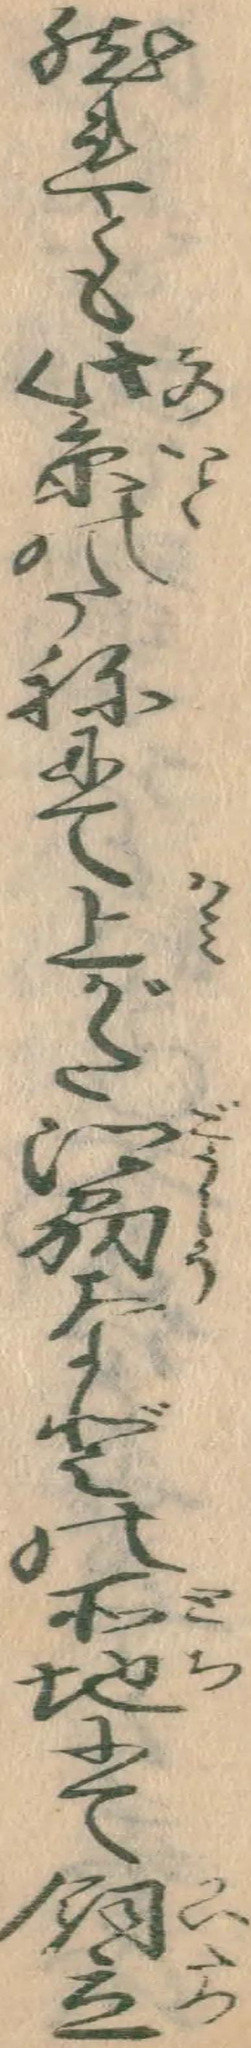然れとも此糸のたねにて上がた江州などの所地にて飼立
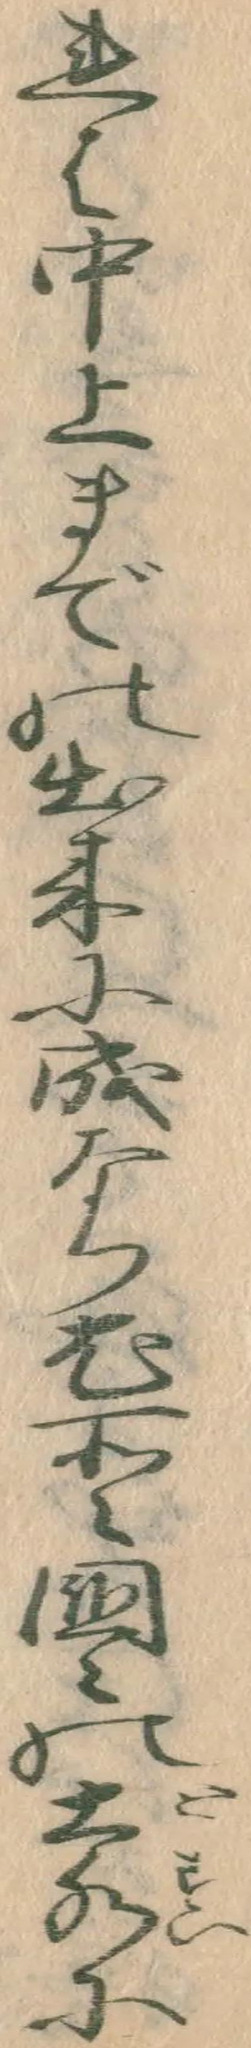れは中上までの出来に成なり尤所々国々の土水に
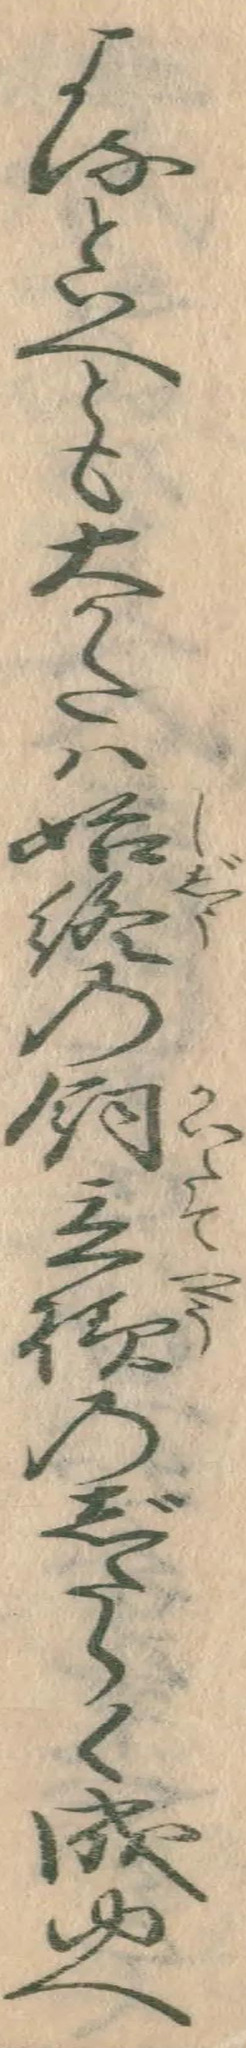よるといへとも大かたは始終の飼立様のじたらく成ゆへ
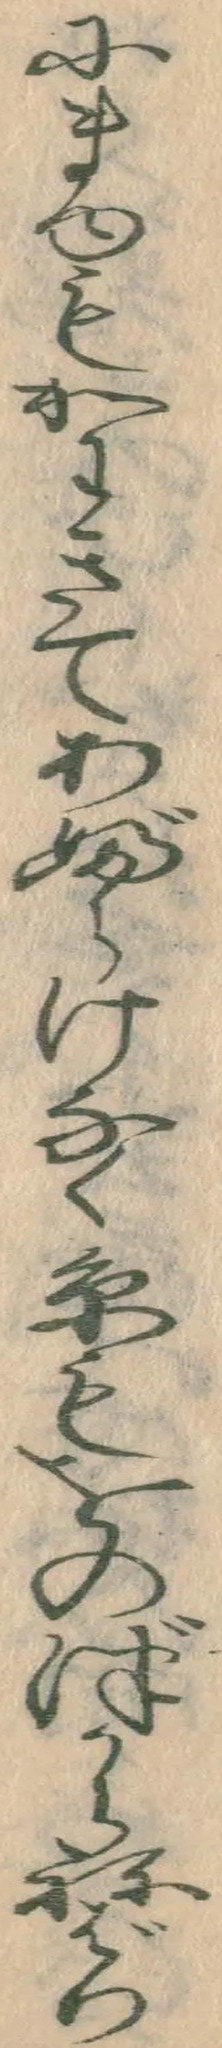にまゆもかわきてあぶらけなく糸もをのづからねばり
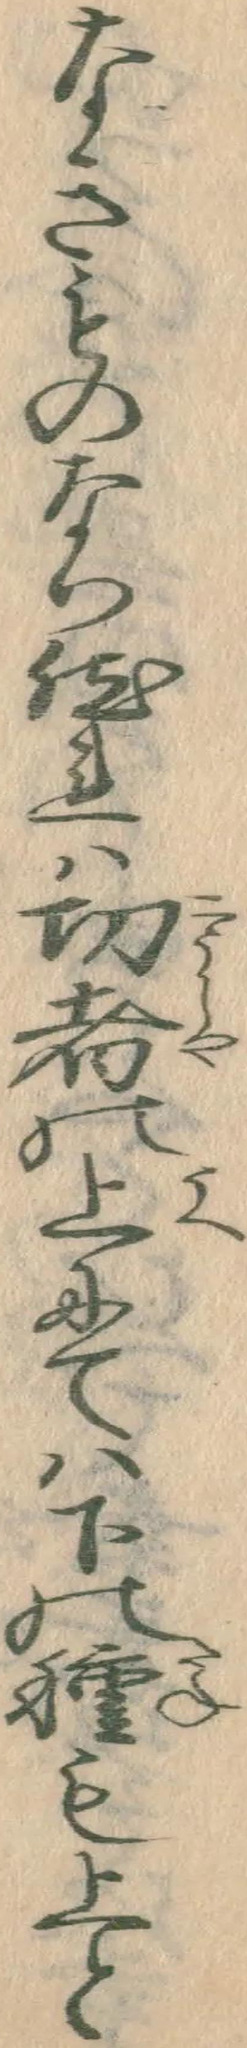なきものなり然れは功者の上にては下の種も上と
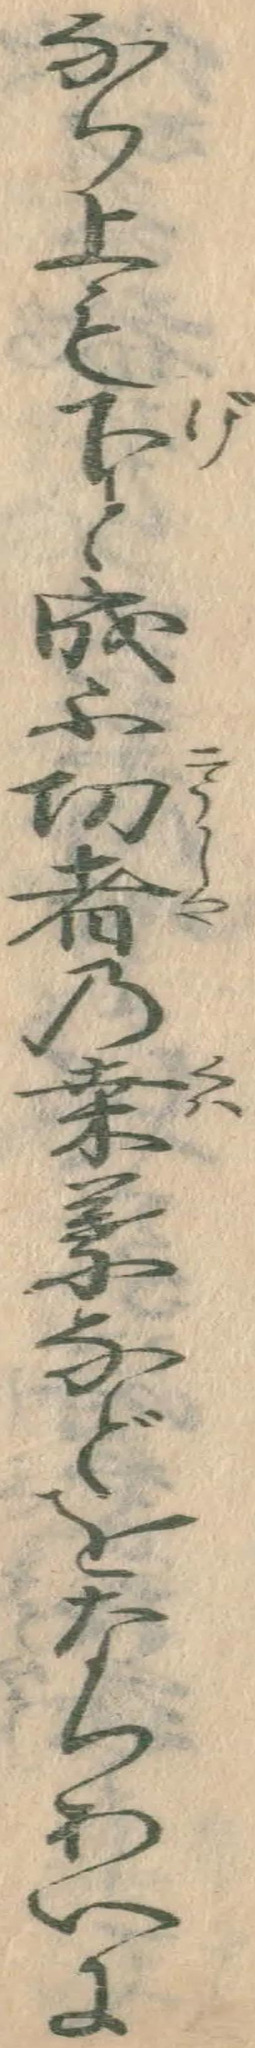なり上も下と成不功者の桑葉などをなりあいに
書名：蚕飼養法記
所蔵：国立国会図書館 National Diet Library, JAPAN
